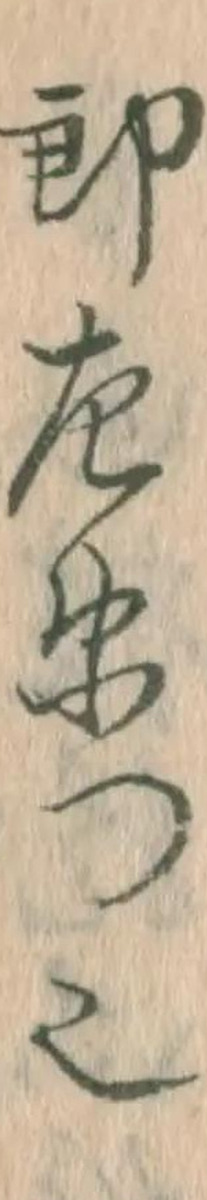老左衛門也
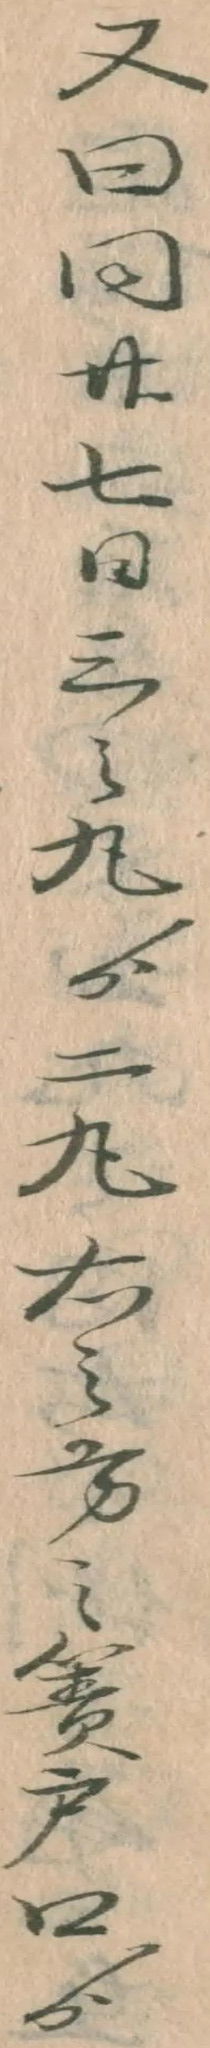又曰同廿七日三之丸ゟ二丸右之方之簀戸口ゟ
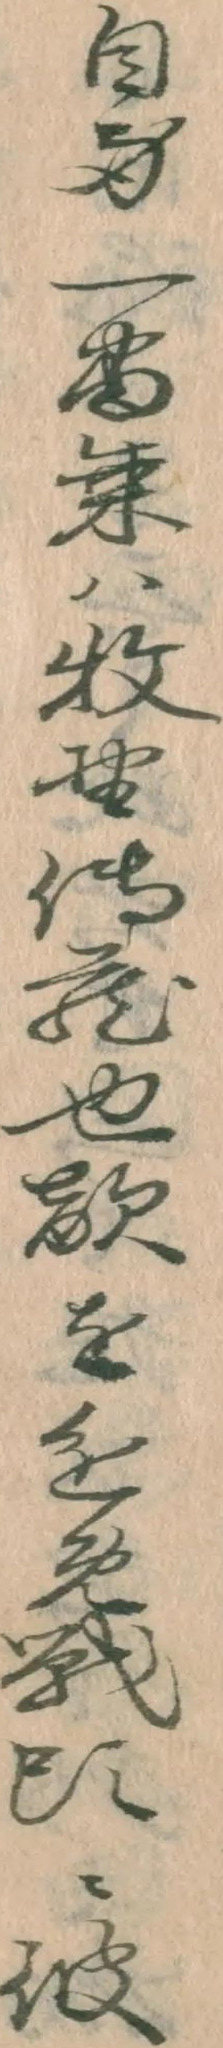自身一番乗は牧野伝蔵也敵を進免戦頭に彼
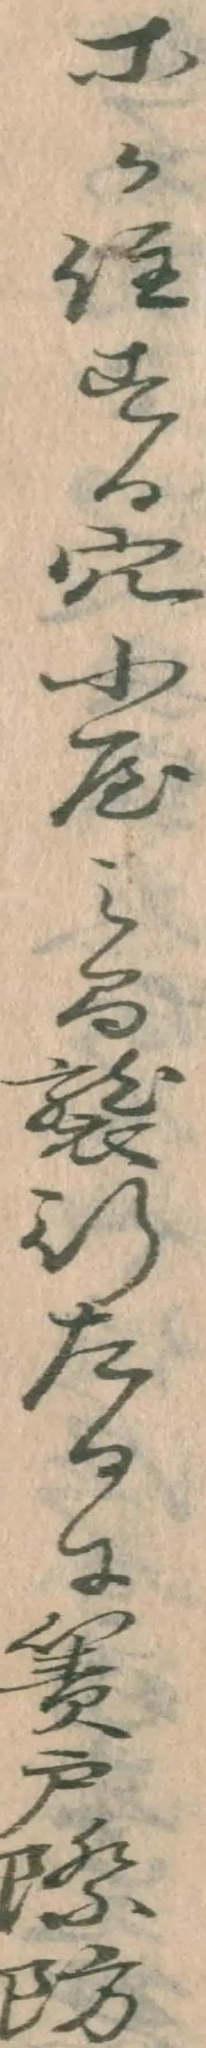等か住春る穴小屋之間襲行たる尓簀戸際防
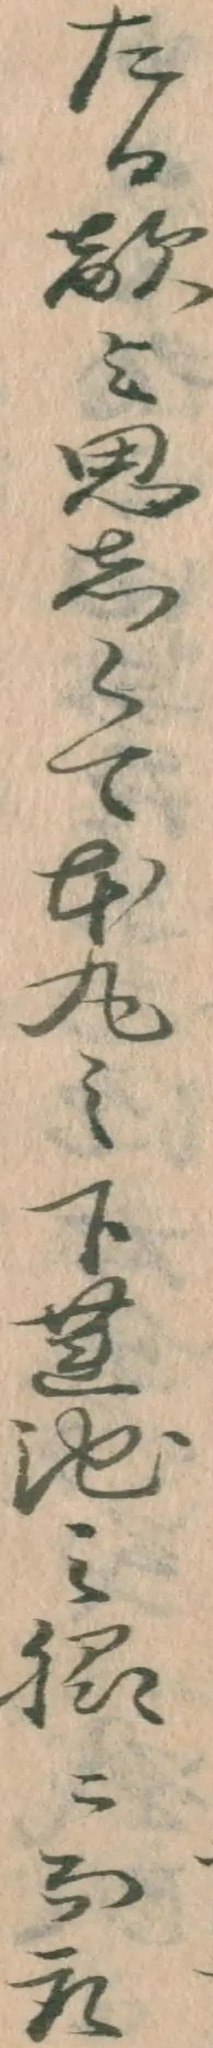たる敵与思志くて本丸之下蓮池之脇に而取
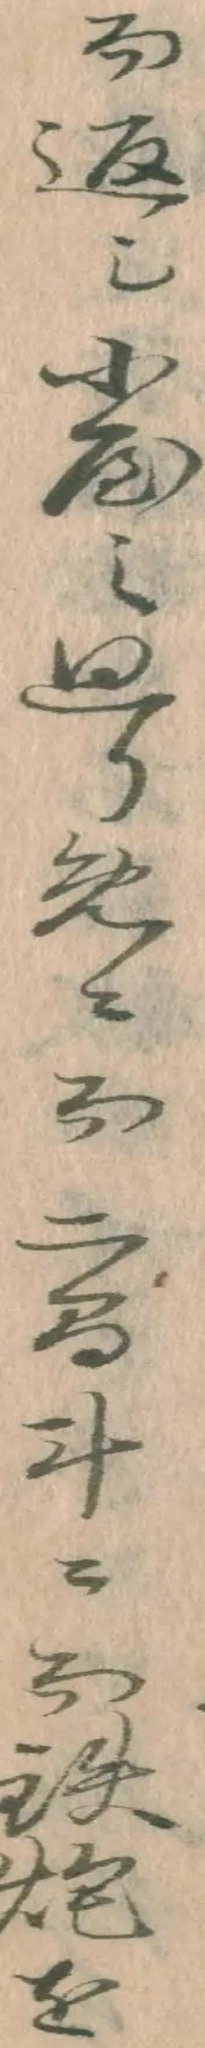而返し小屋之廻り免に而二間斗に而鉄砲を
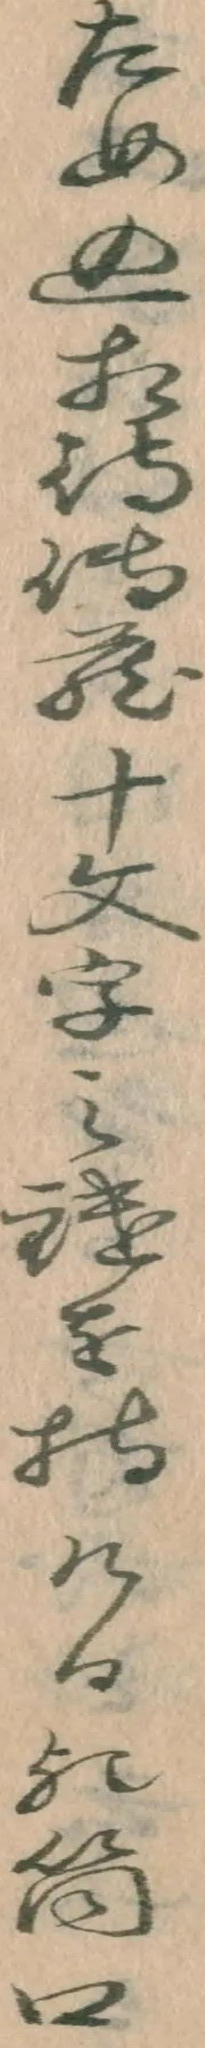ため込相待伝蔵十文字之鑓を持ける歟筒口
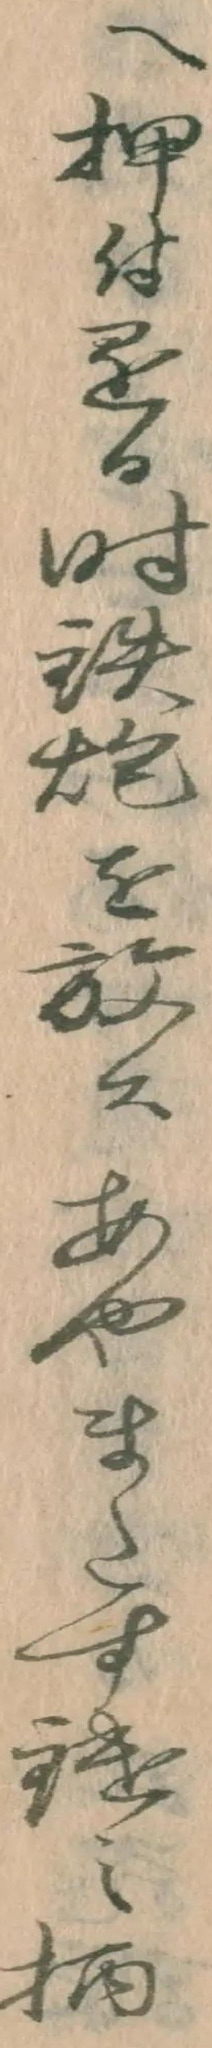へ押付懸る時鉄砲を放すあやまたす鑓之柄
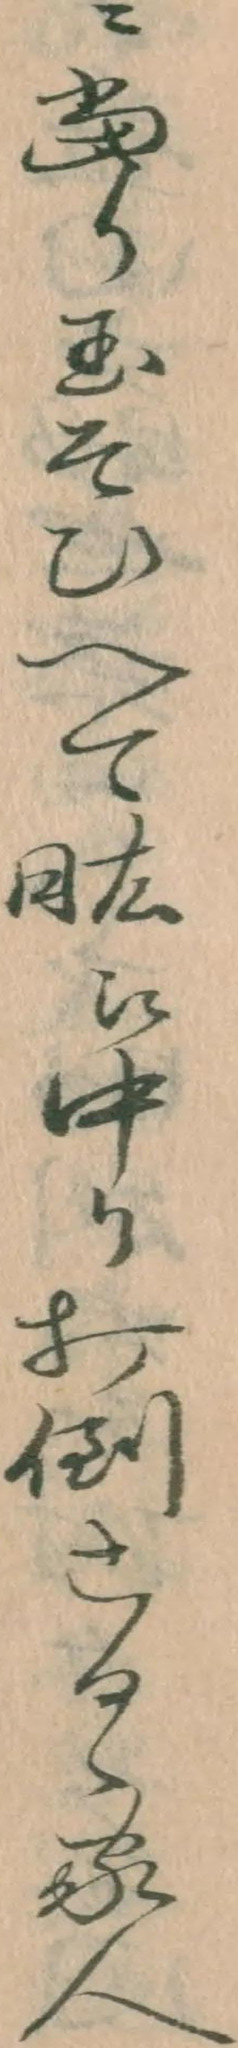に当り玉そひへて肱江中り打倒さるゝ家人
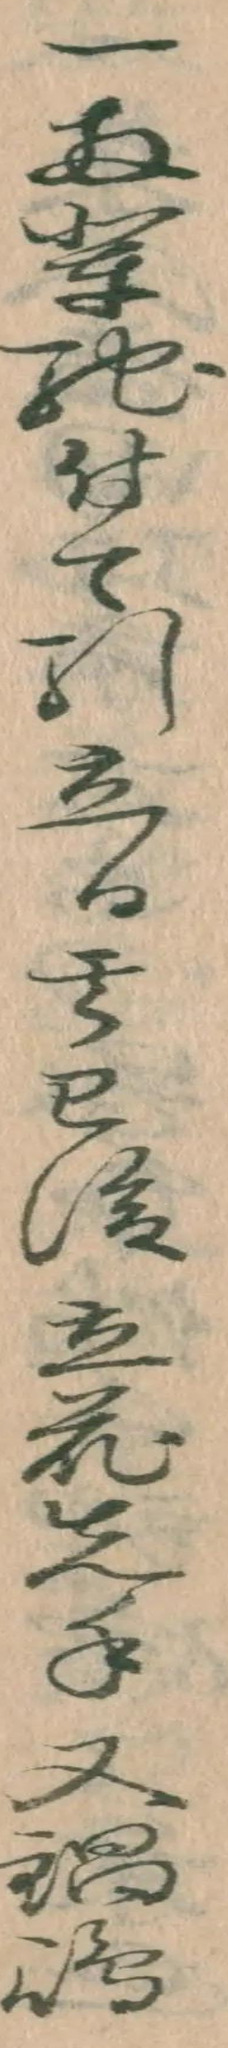一番輩馳付て引立る其已後立花先手又鍋島
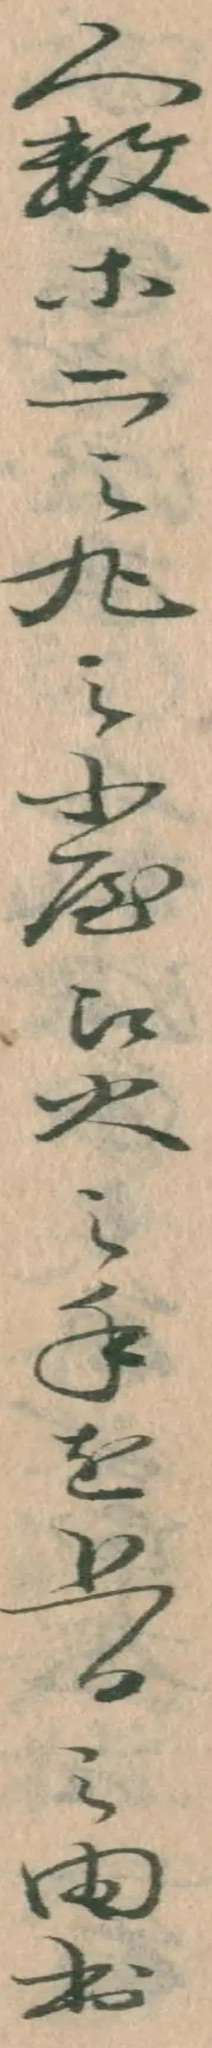人数等二之丸之小屋江火之手を上る之由出
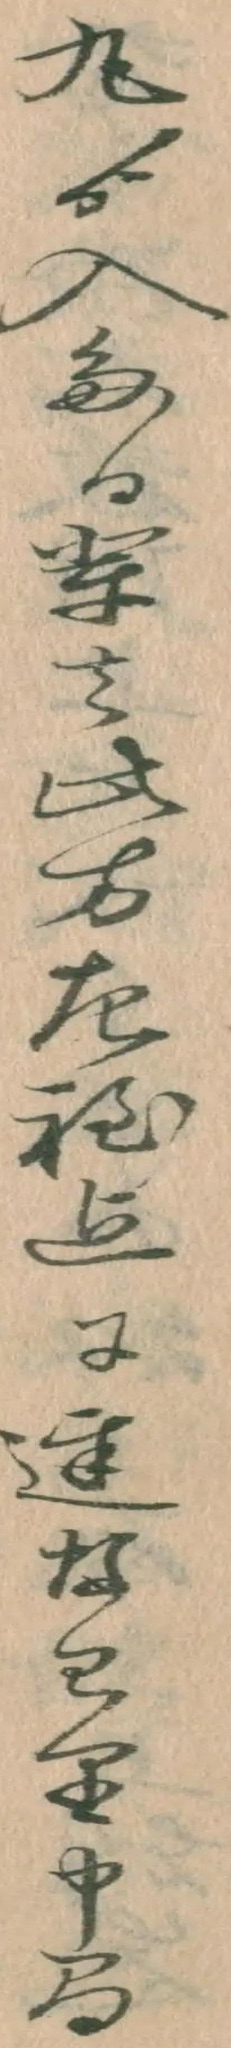丸ゟ入多る輩者此方左程迄尓遅な已里申間
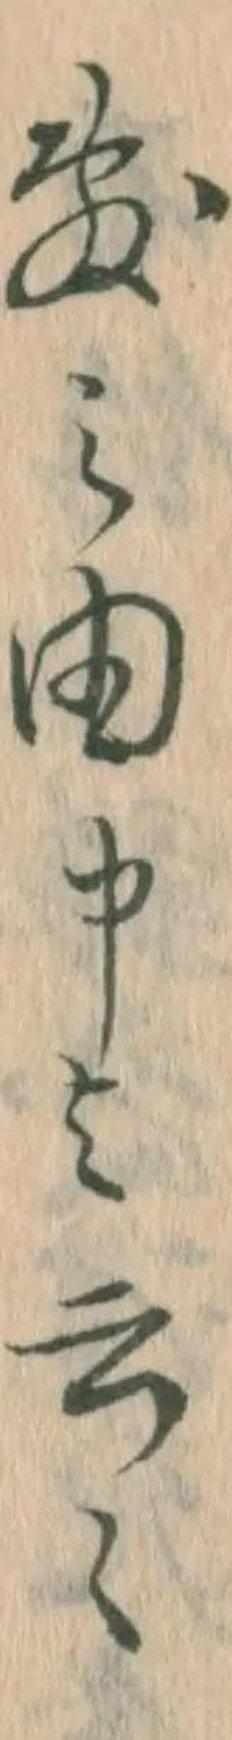敷之由申与云々
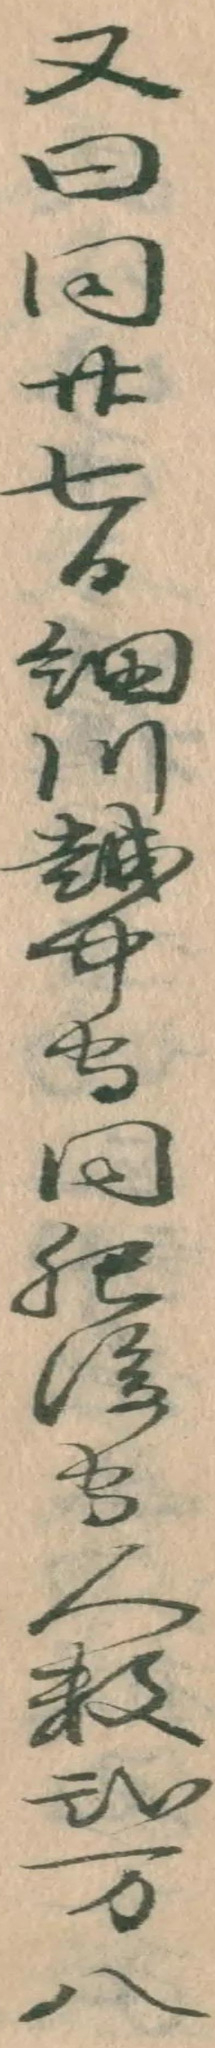又曰同廿七日細川越中守同肥後守人数弐万八
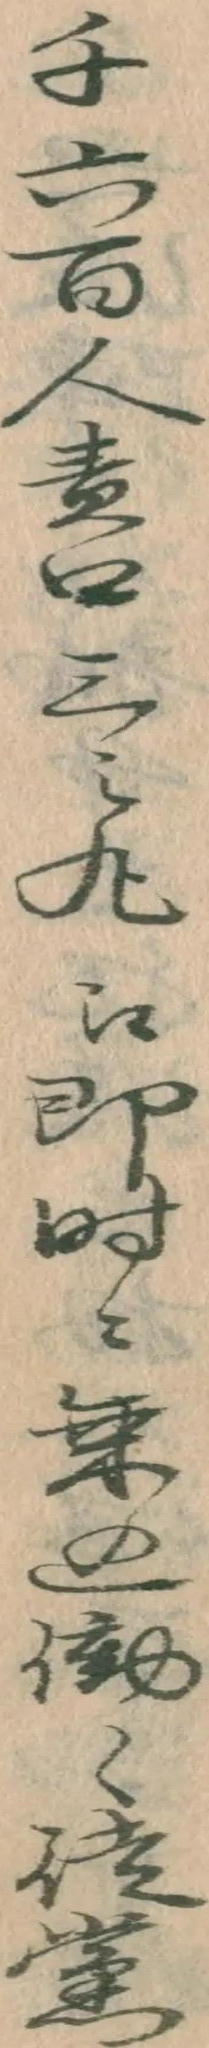千六百人責口三之丸江即時に乗込働く徒党
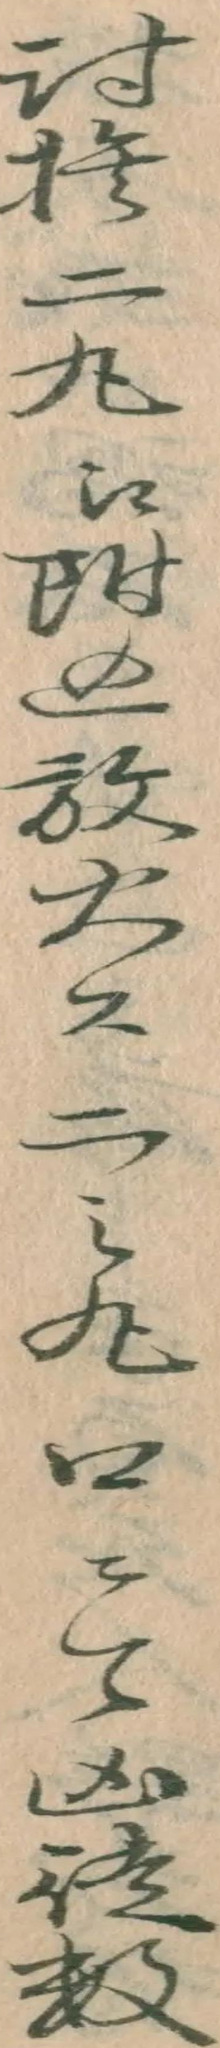討捨二丸江附込放火す二之丸口にて凶徒数
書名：切支丹御退治記 49巻. [8]
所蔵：国立国会図書館 National Diet Library, JAPAN
